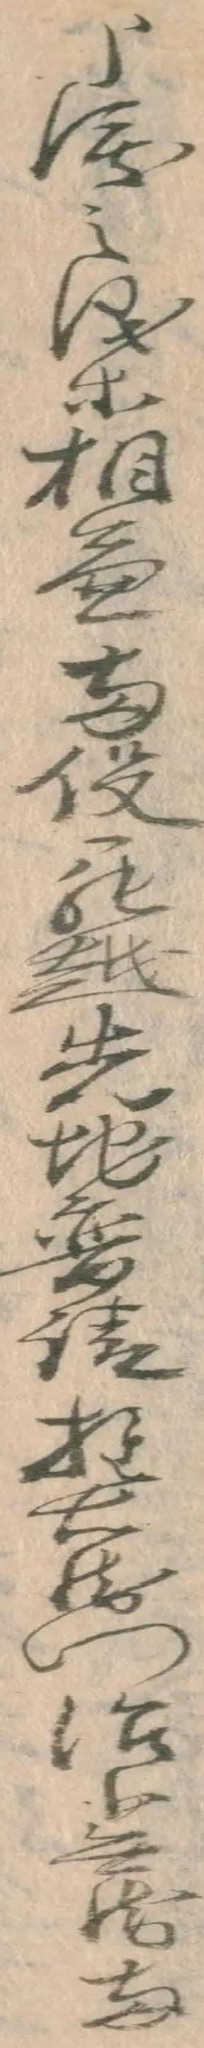申渡之儀等相兼両役罷越先地普請権右衛門治部兵衛両
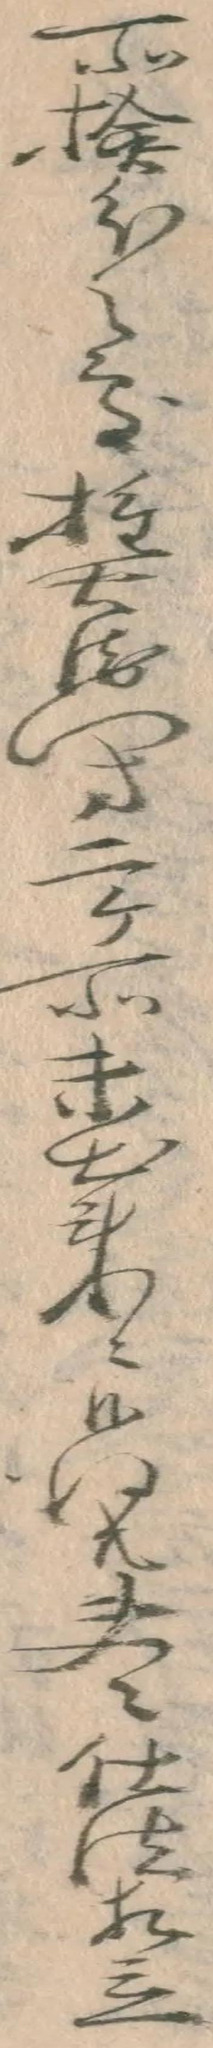所検分之處権右衛門方二ヶ所未出来に候得共夫〻仕法相立
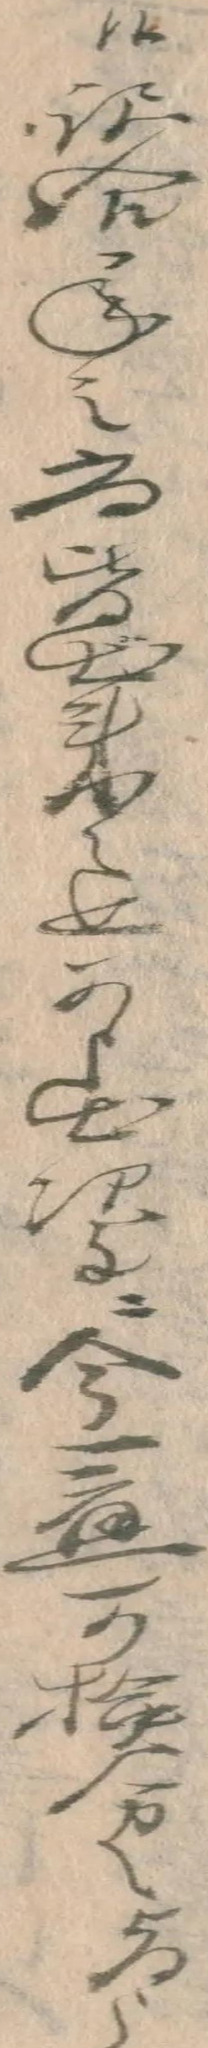候訳合年之尚皆出来之上可申出次与ニ今一應可検分之旨被
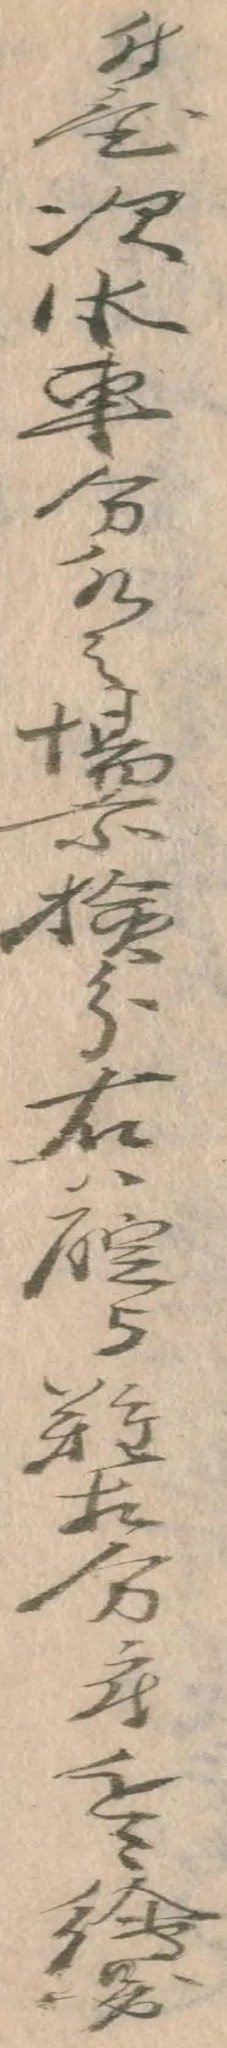付置次水車分水之場所検分右ハ碇と難相分ニ付近々絵図
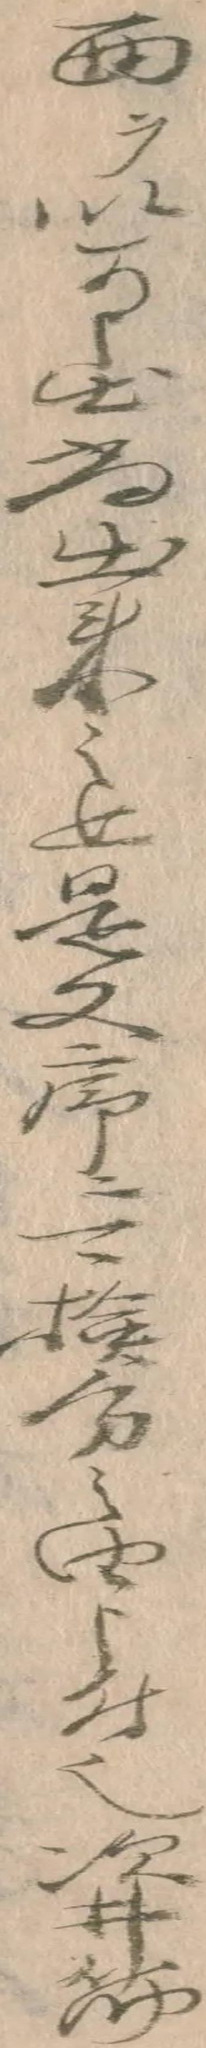面ヲ以可申出尚出来之上是又序ニ可検分之由申付也次井筋
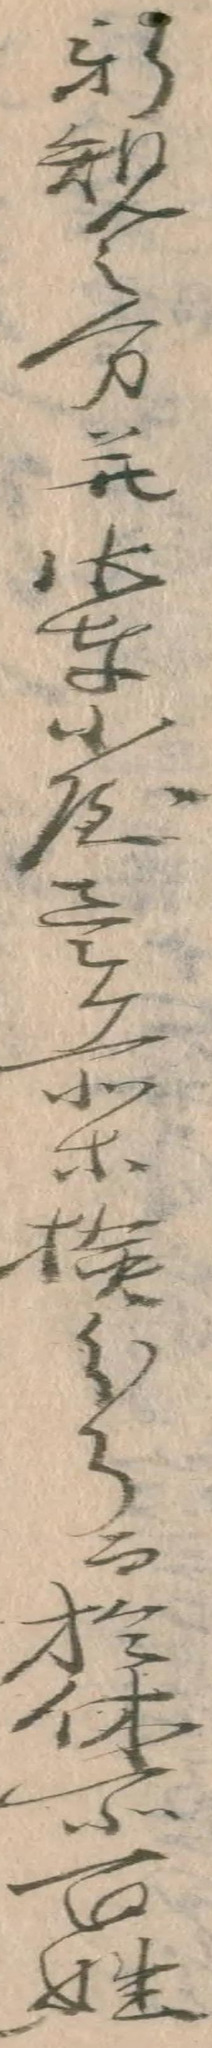新規之分并水車小屋壱ヶ所等検分了而於休所百姓
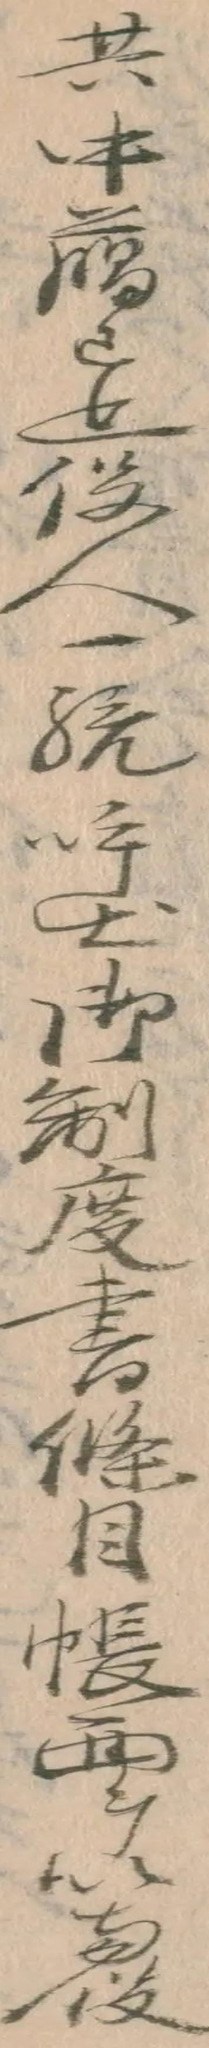共中臈已上役人一統呼出御制度書條目帳面ヲ以両役
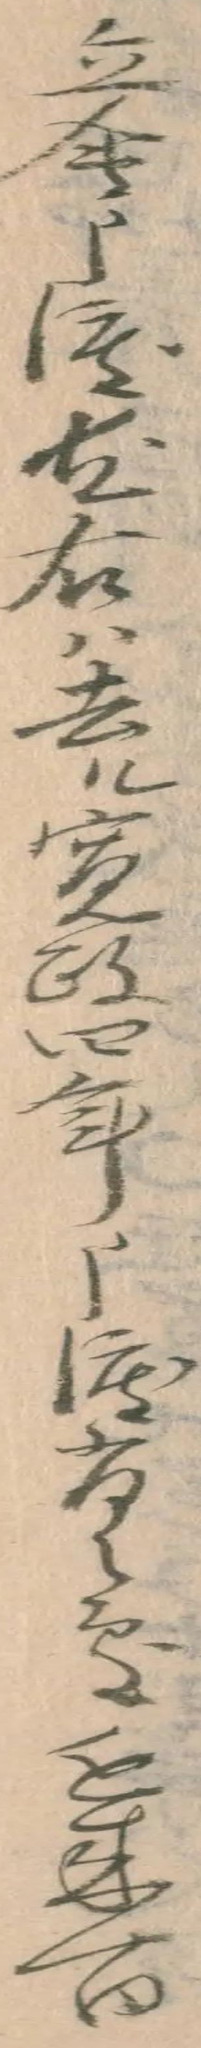立會申渡尤右ハ去ル寛政四年申渡有之處近来百
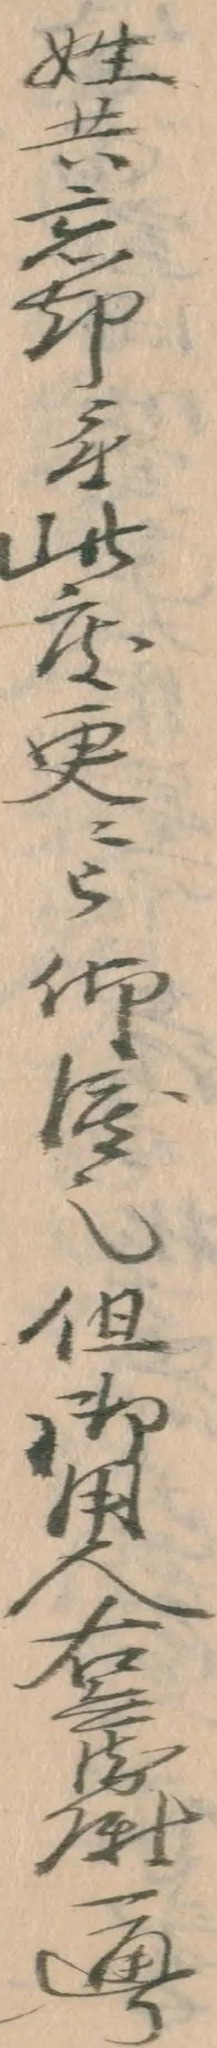姓共忘却ニ付此度更ニ被仰渡也但御用人右兵衛尉一通り
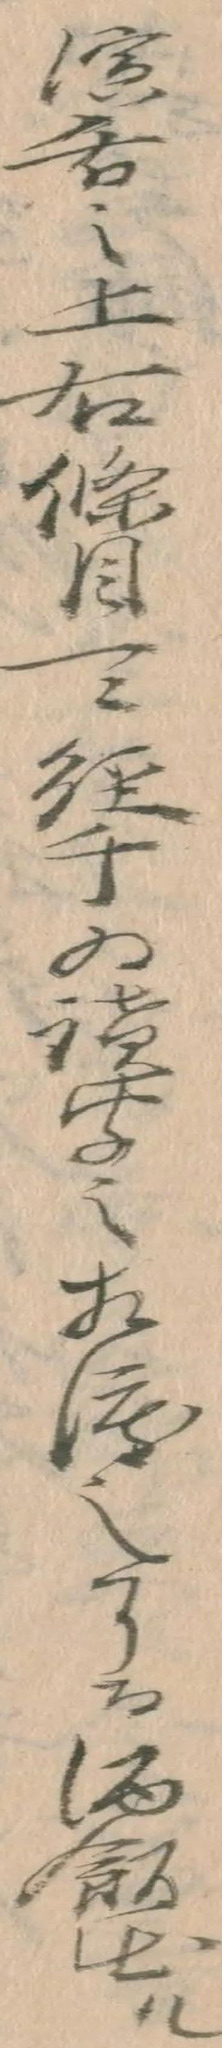演舌之上右條目可経千為讀聞之相渡之了而酒飯出ル
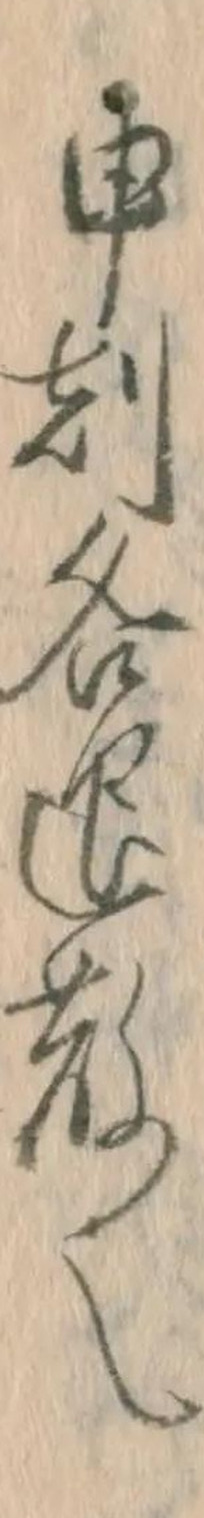申刻各退散也
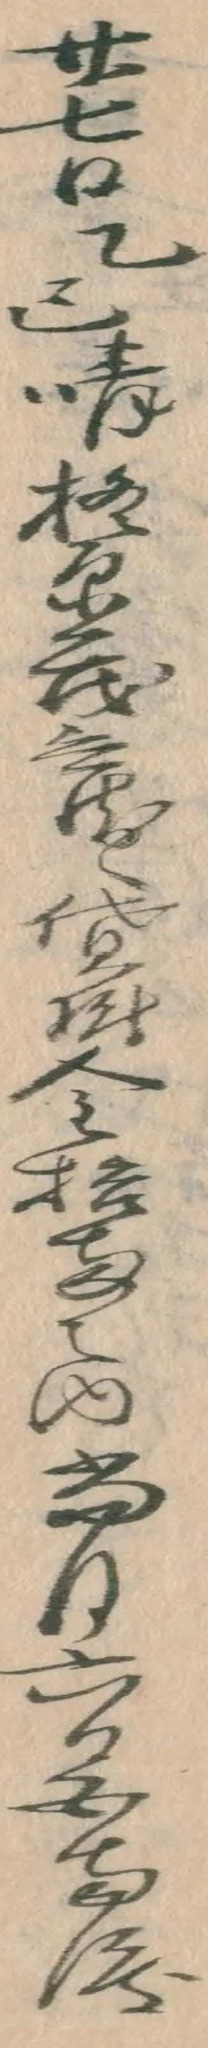廿七日乙巳晴柊原茂兵衛へ貸附金拾両之内當月六日五両渡
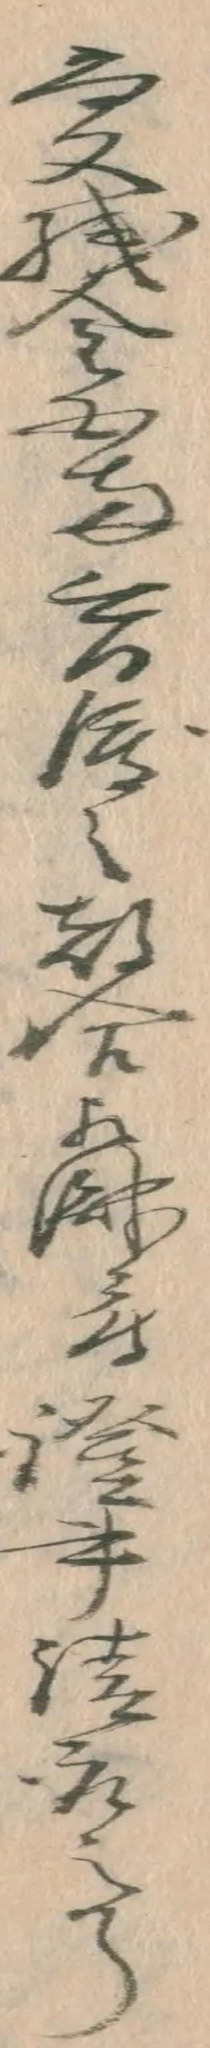尚又紙金五両今日渡之都合相済ニ付證書請取之了
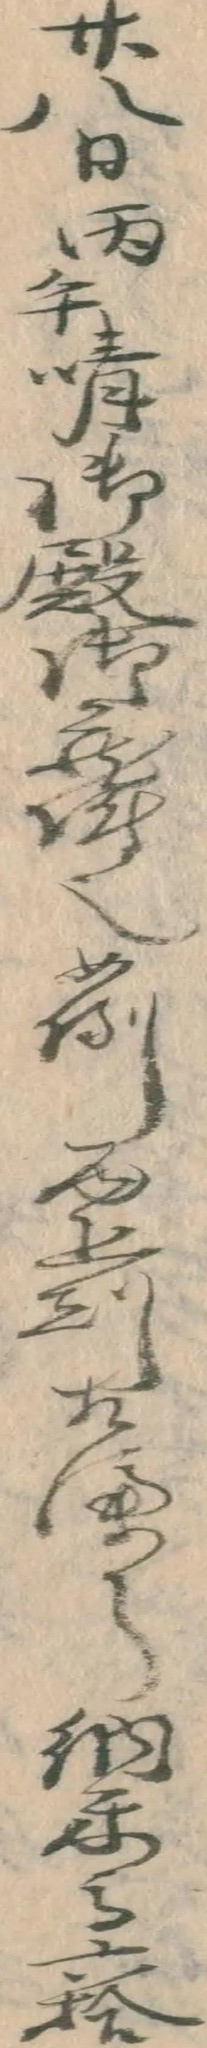廿八日丙午晴御殿御蔵附之如例酉上刻相済了納米高六拾
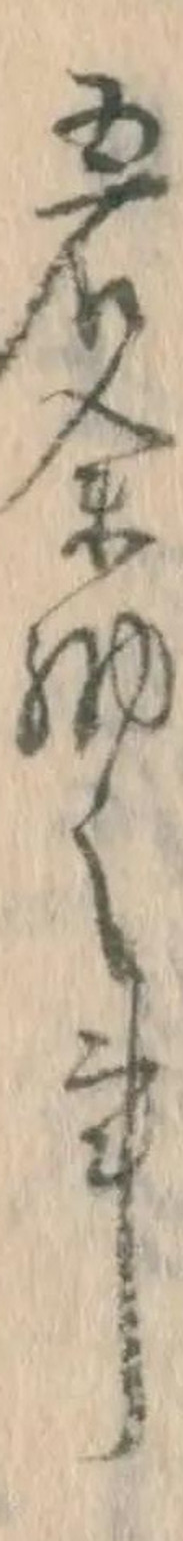五石余納之事
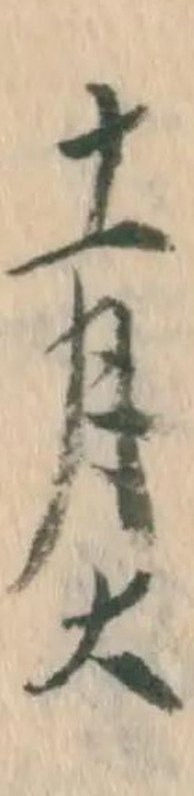十一月大
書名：賀茂社記録. 第66冊
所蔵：国立国会図書館 National Diet Library, JAPAN
